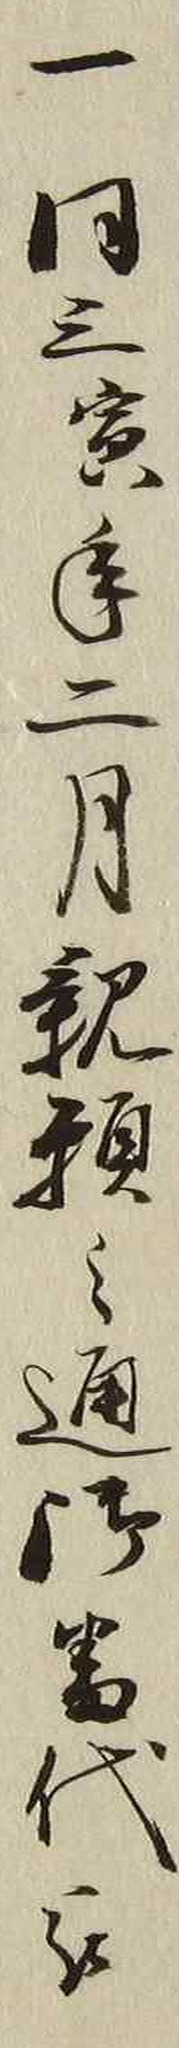一同三寅年二月親願之通御番代被
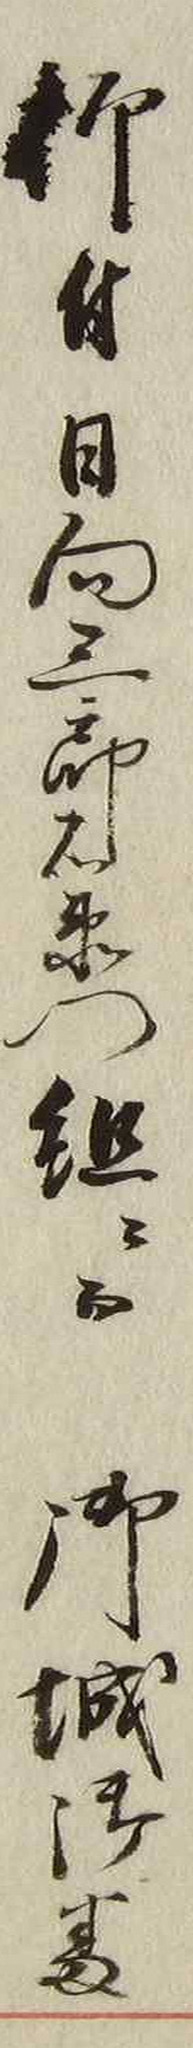抑付日向三郎右衛門組ニ而御城御番
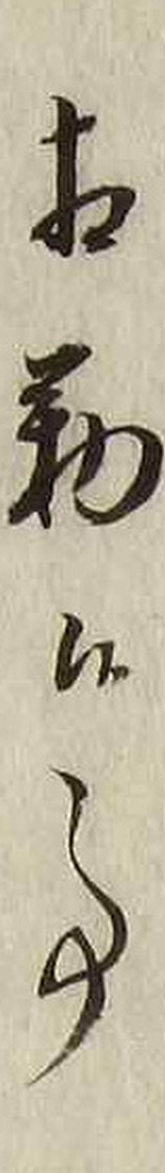相勤候事
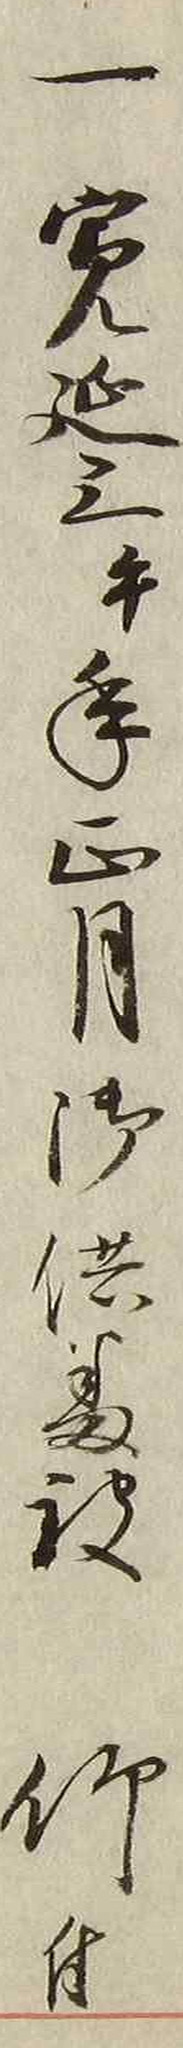一寛延三午年正月御供番被仰付
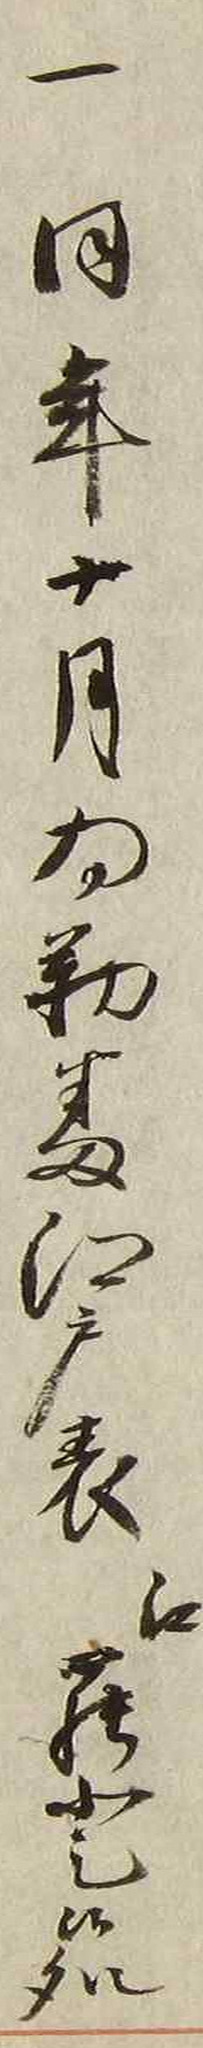一同年十月為勤番江戸表江罷登候処
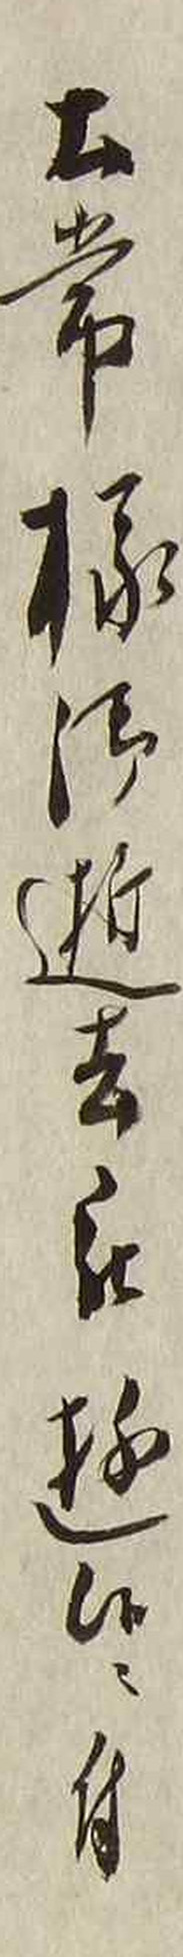土常様御近去被遊候ニ付
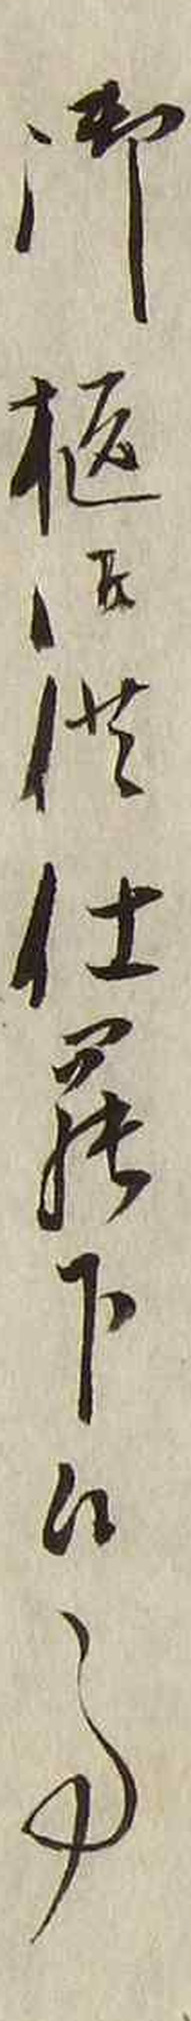御柩御供仕罷下候事

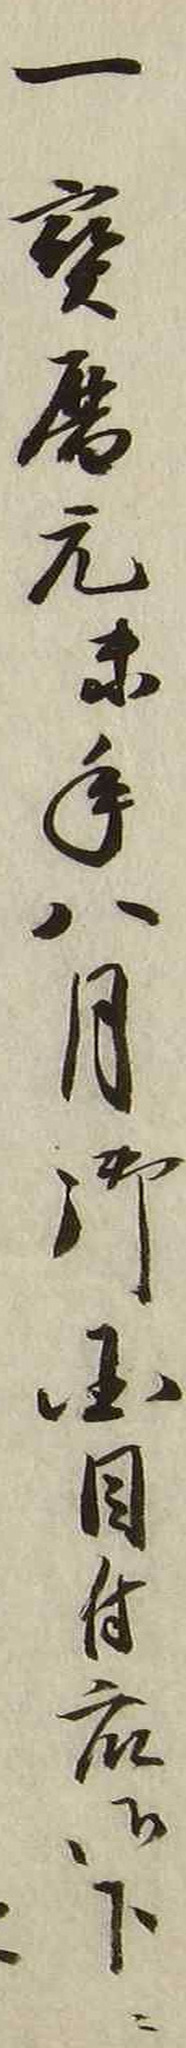一宝暦元未年八月御国目付衆御下ニ
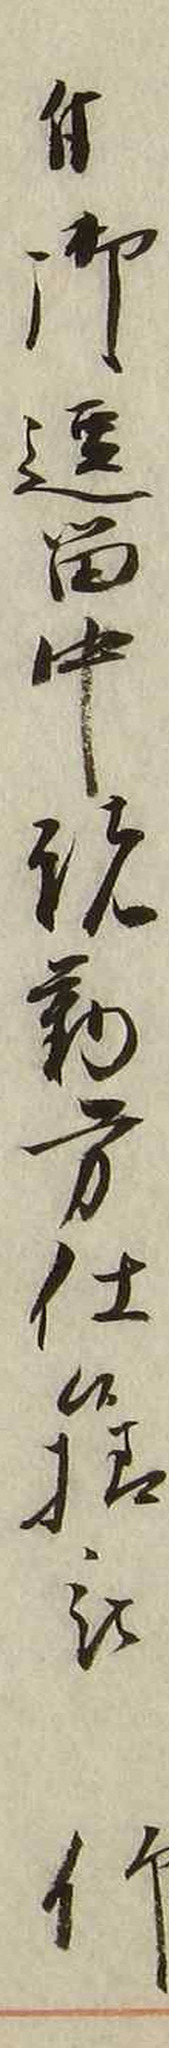付御逗留中諸勤方仕候様被仰
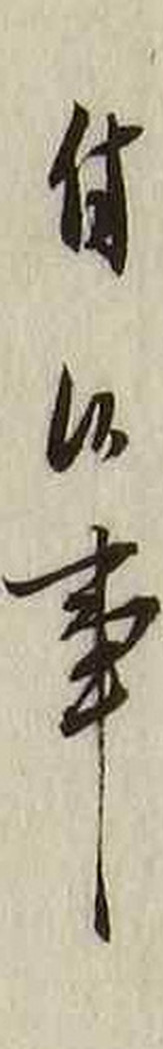付候事
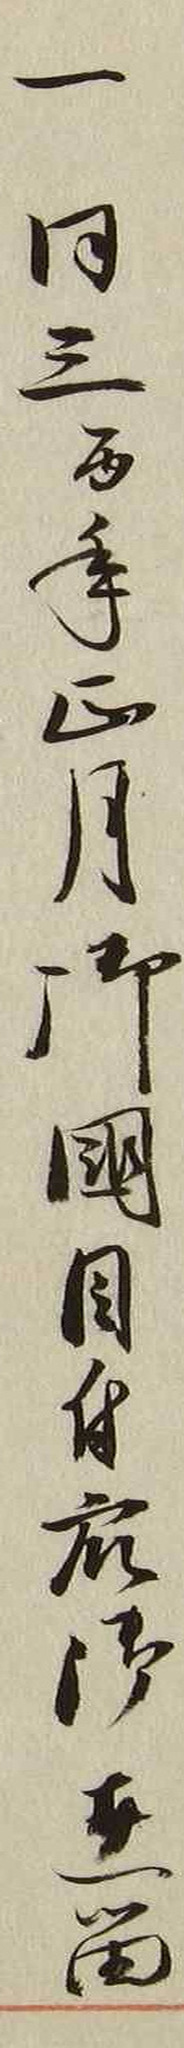一同三酉年正月御国目付衆御在留
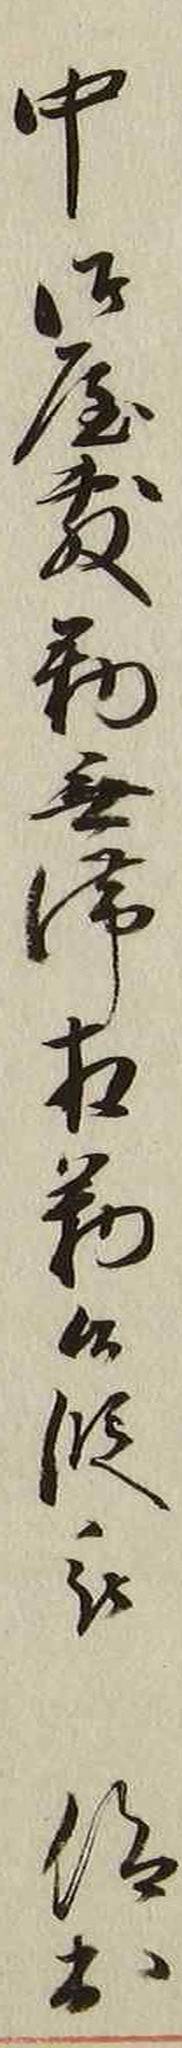中御屋敷勤無滞相勤候段被仰出
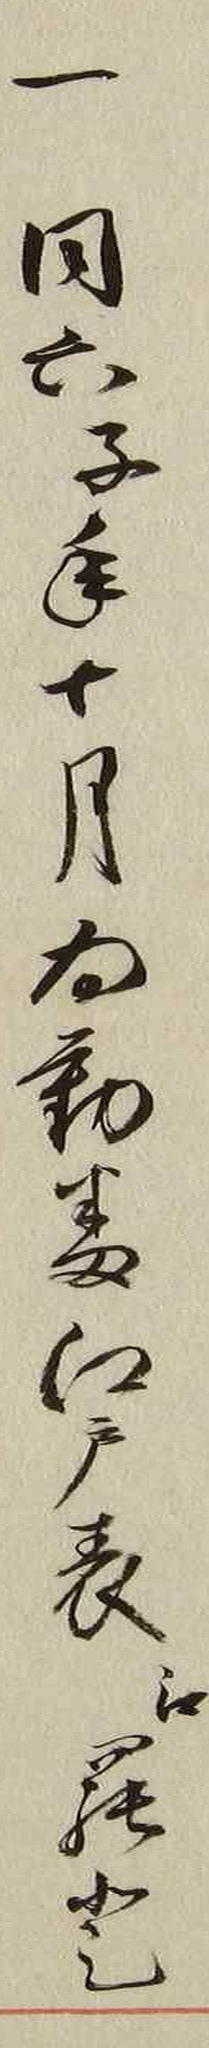一同六子年十月為動番江戸表江罷登
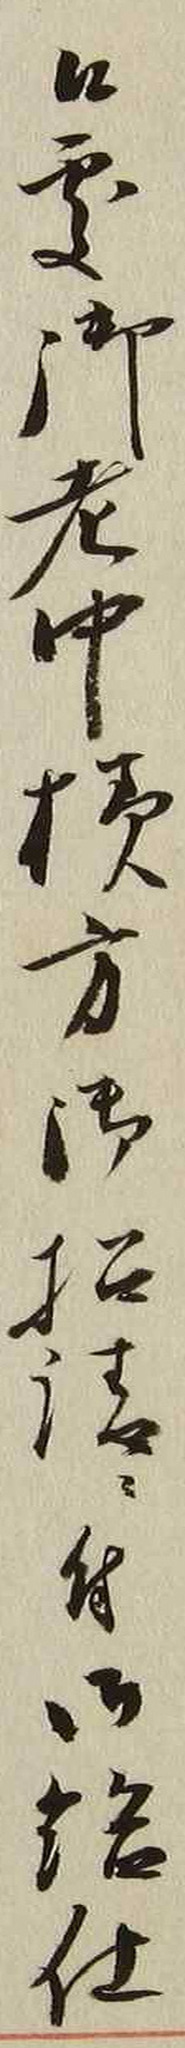候処御老中様方御招請ニ付御給仕
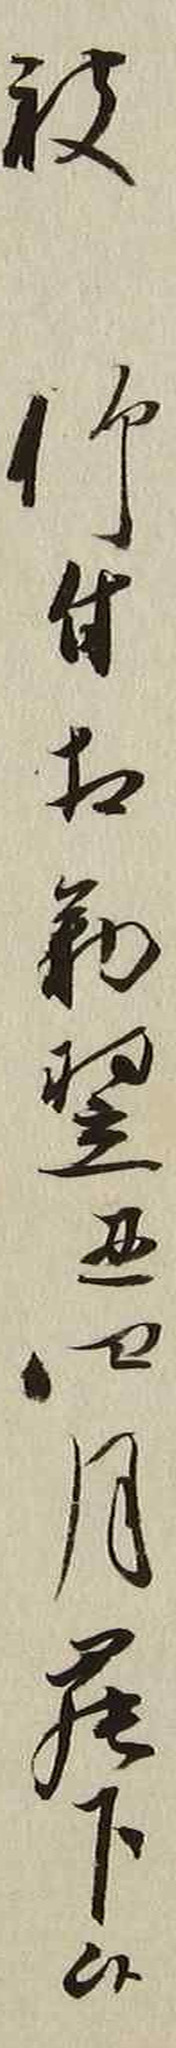被仰付相勤翌丑四月罷下候
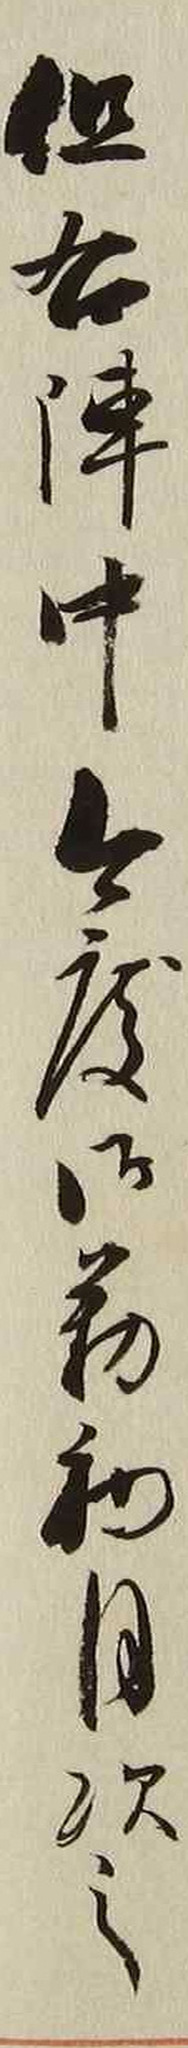但右陣中今度御勤初月次之
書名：諸士系譜　巻之22　い之部22
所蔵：会津若松市立会津図書館
